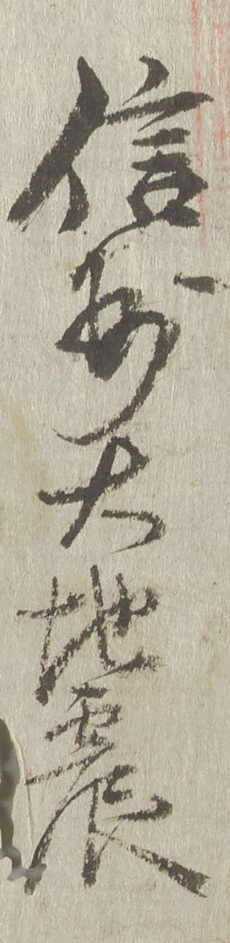信州大地震
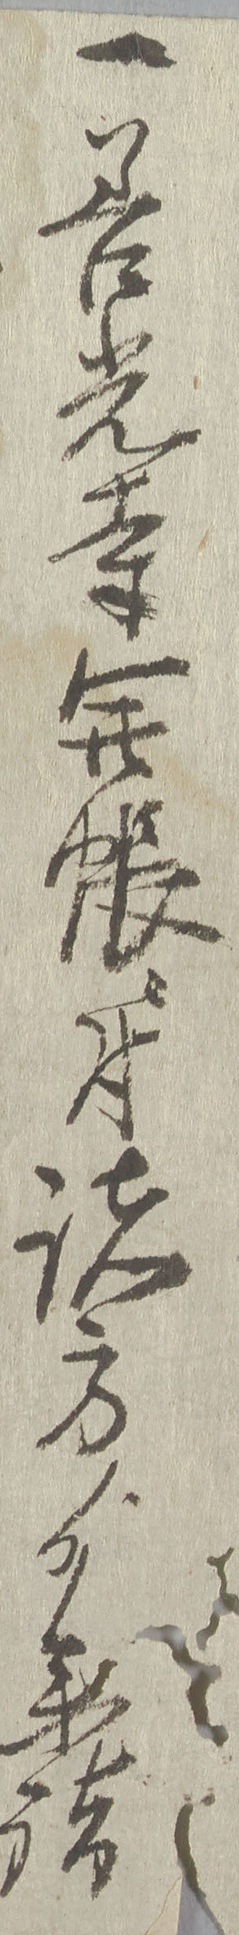一善光寺開帳ニ付諸方ゟ参詣
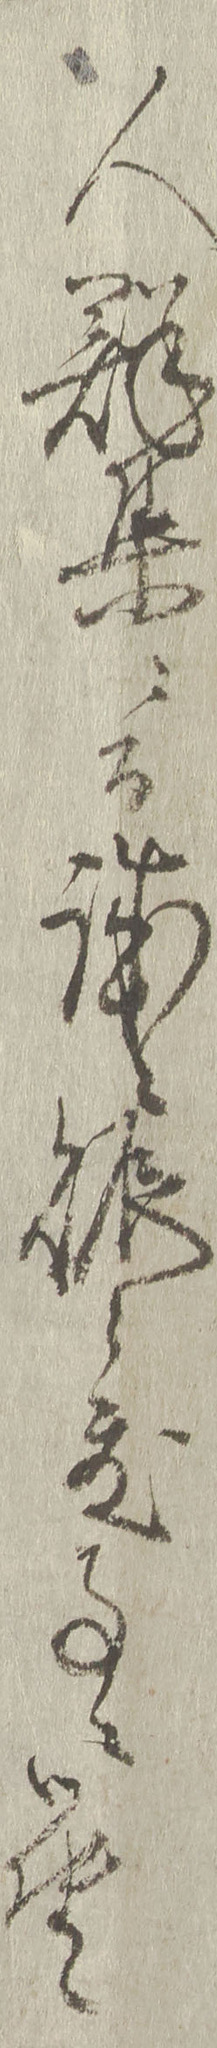人群集ニ而誠ニ賑々敷事ニ御座候
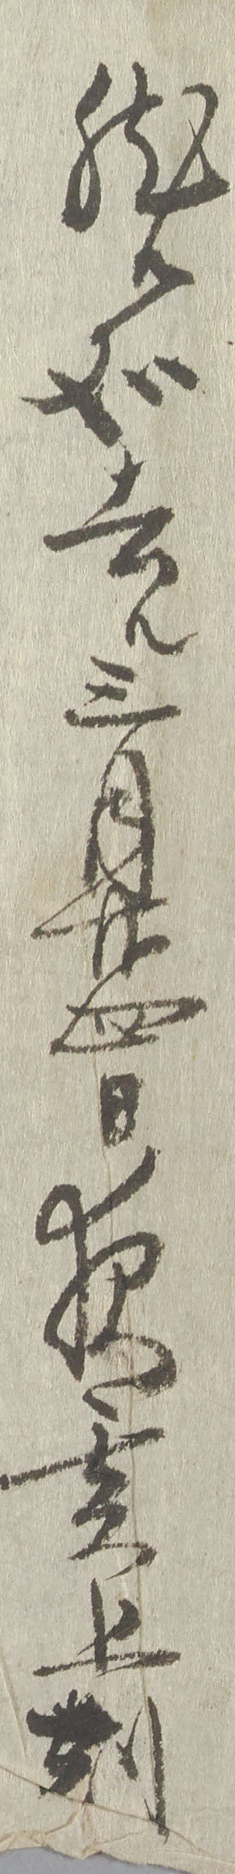然ル処去ル三月廿四日夜亥上刻
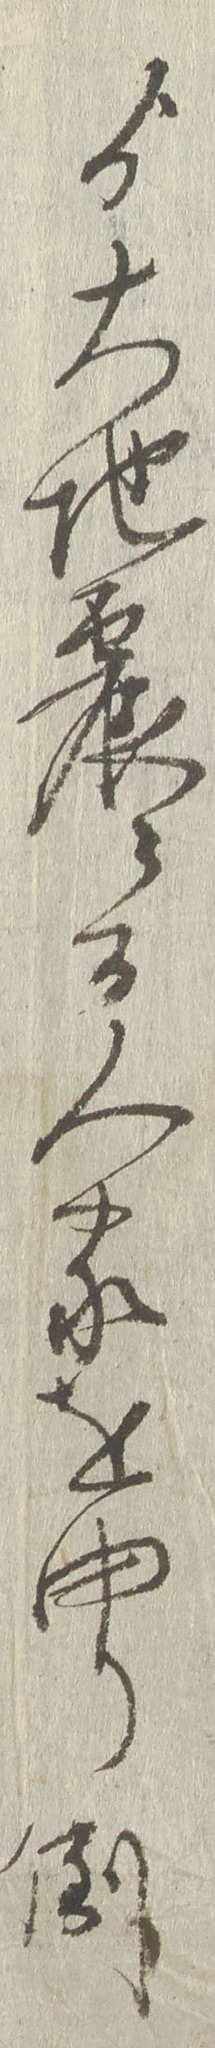ゟ大地震ニ而人家をゆり倒
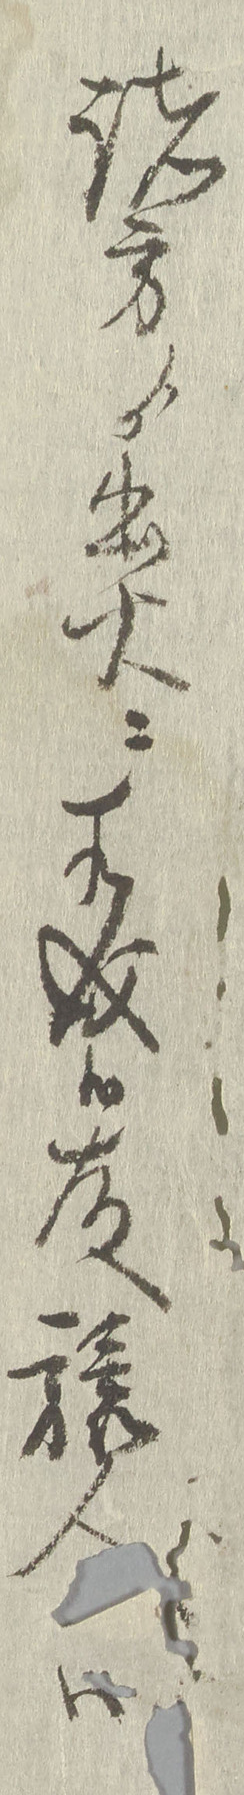諸方ゟ出火ニ相成候故旅人ハ
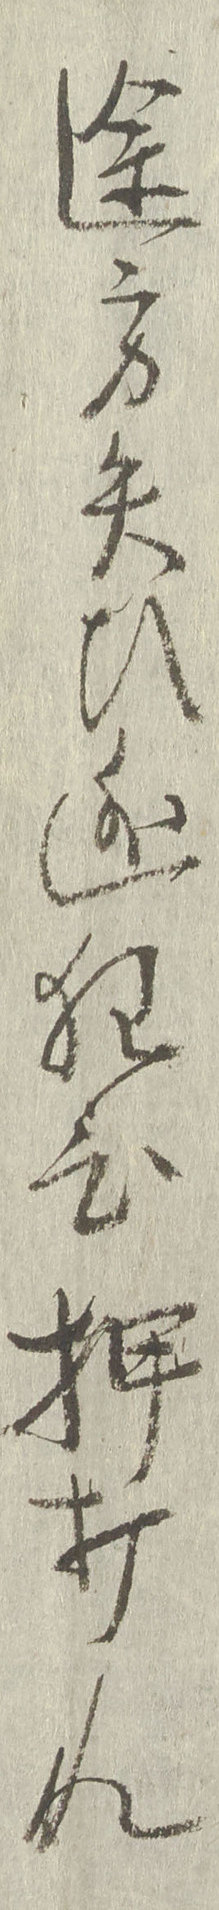途方失ひ逃狂ひ押打れ
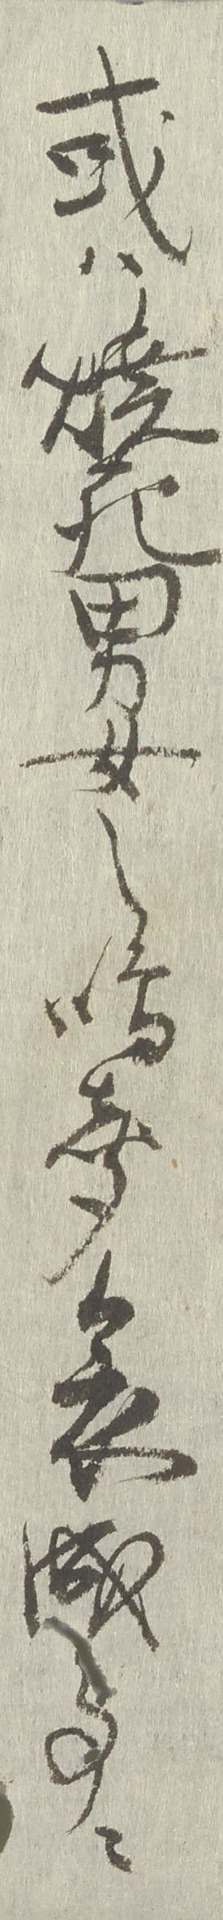或ハ焼死男女之鳴聲哀成事ニ
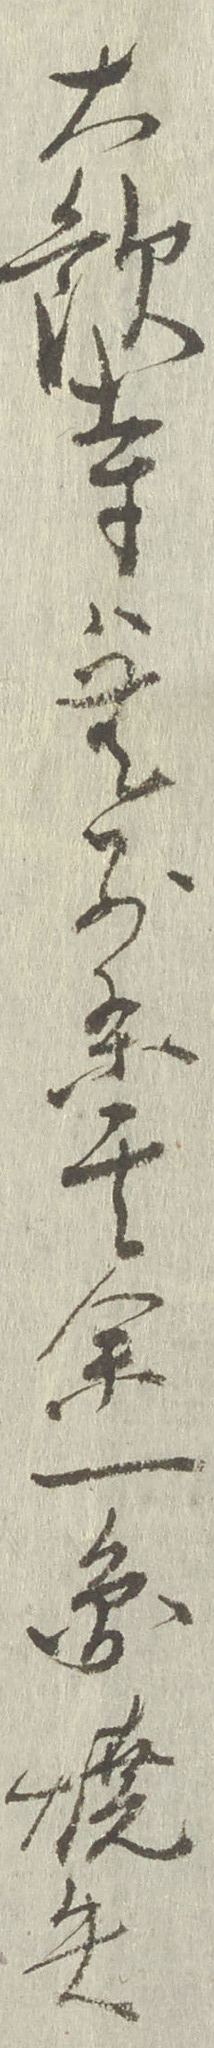大歓寺ハ無別条其余一圓焼失
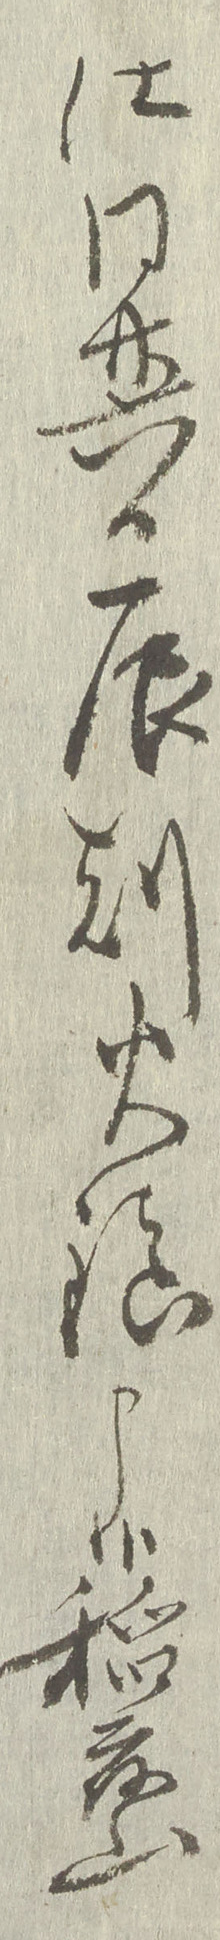仕同廿六日辰刻火鎮申候稲荷山
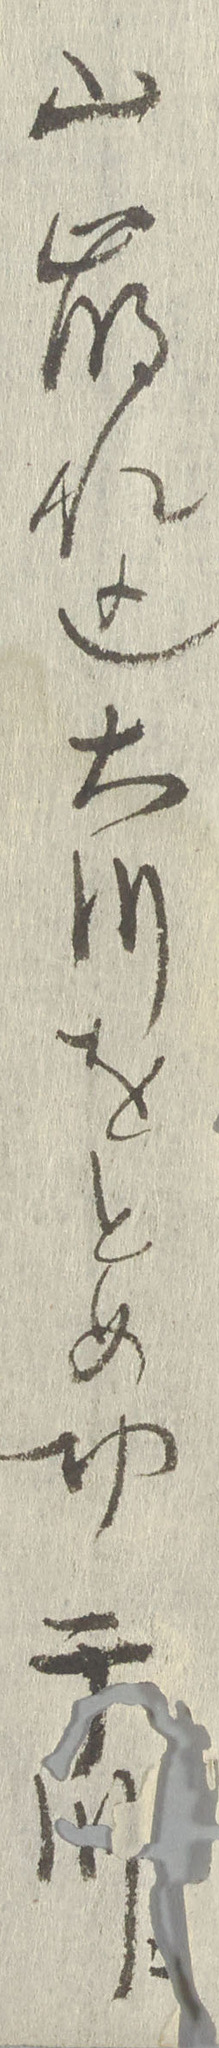山崩れ込大川をとめ切干川ニ
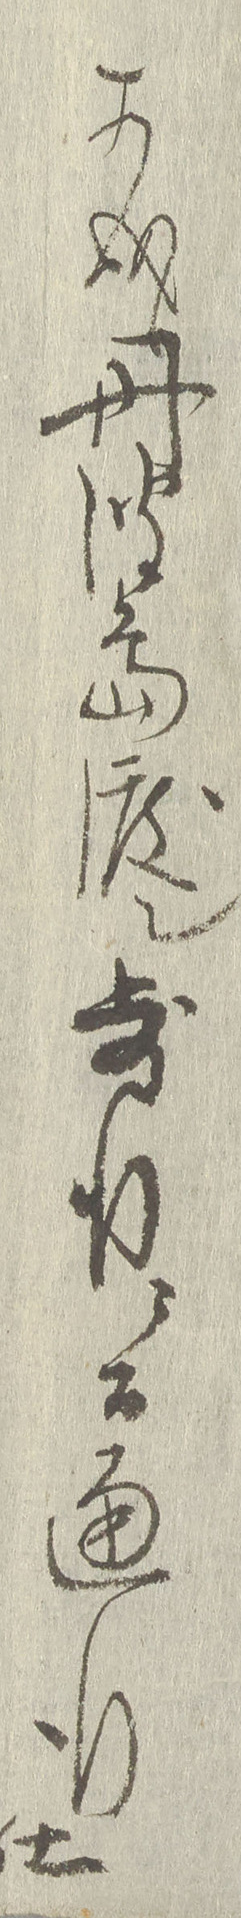相成丹波島渡シ歩行ニテ通行仕
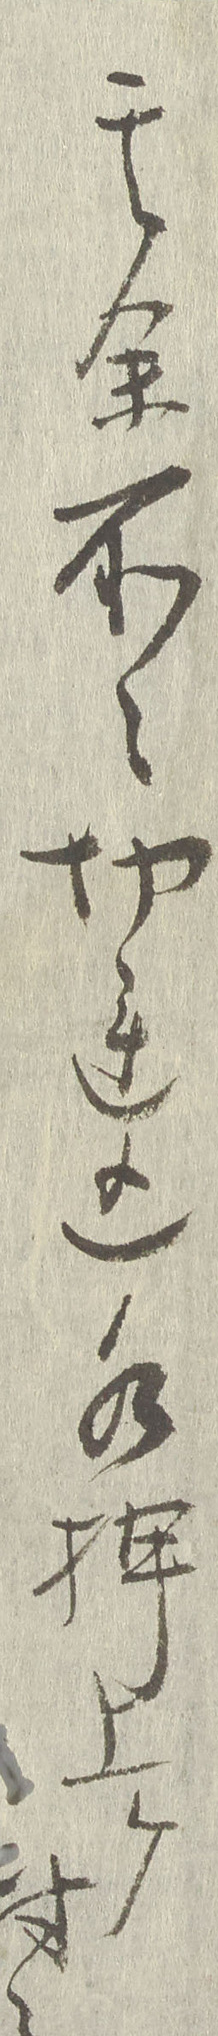其余所々切れ込水押上ケ村々
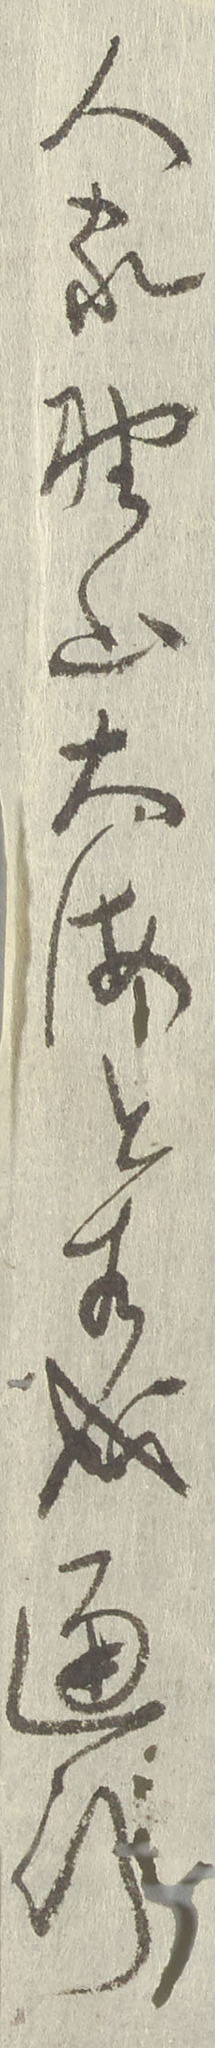人家野山大海と相成通行
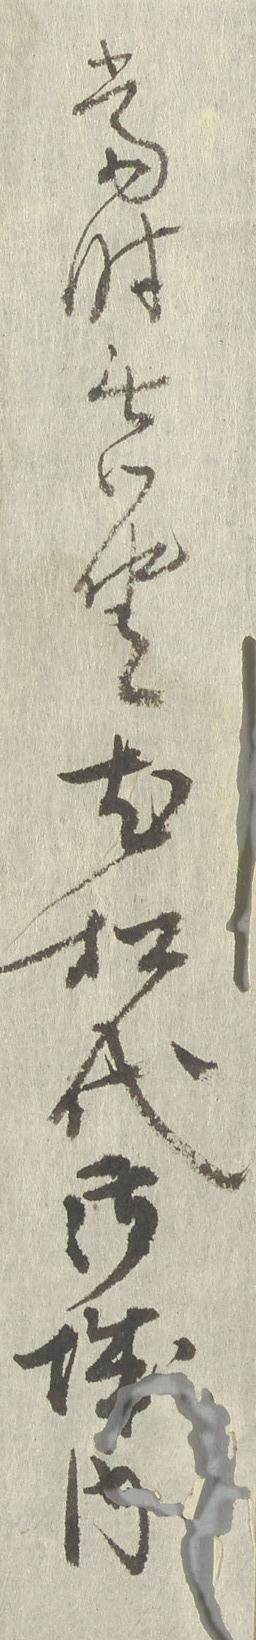当時無御座候尤松代御城内
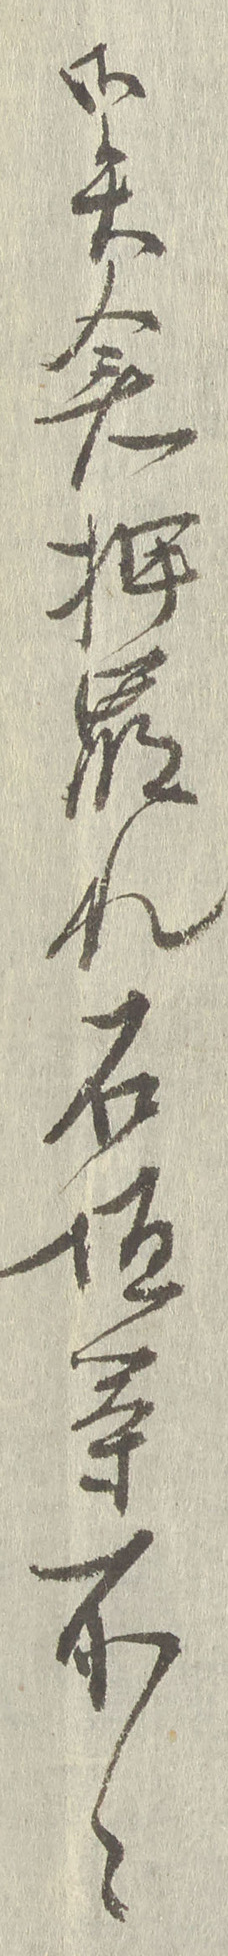御矢倉押崩れ石垣等所々
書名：信濃大地震
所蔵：東京大学総合図書館 General Library in the University of Tokyo, JAPAN
